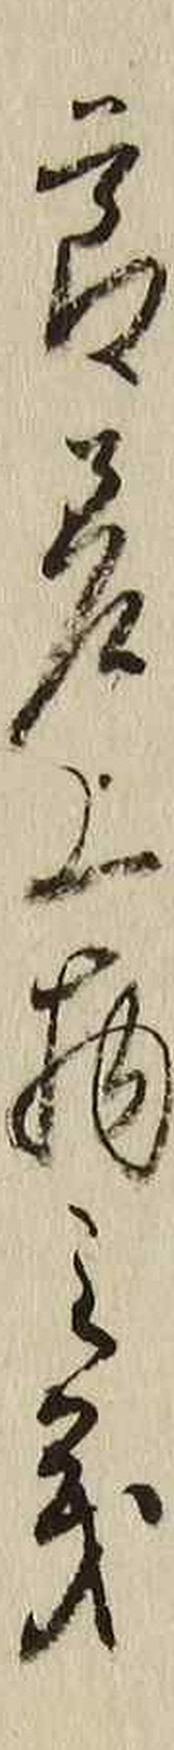節差上物之義
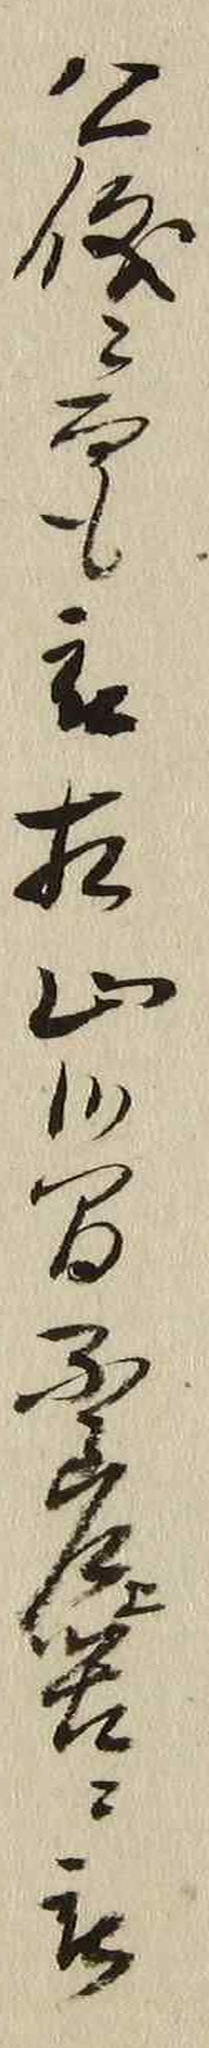公儀ニ而も被相止候間不差上筈ニ被
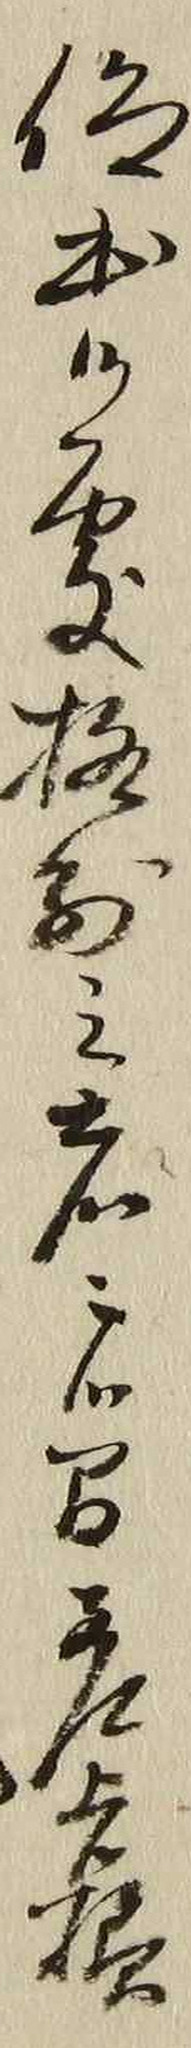仰出候処格別之者ニ候間差上候様
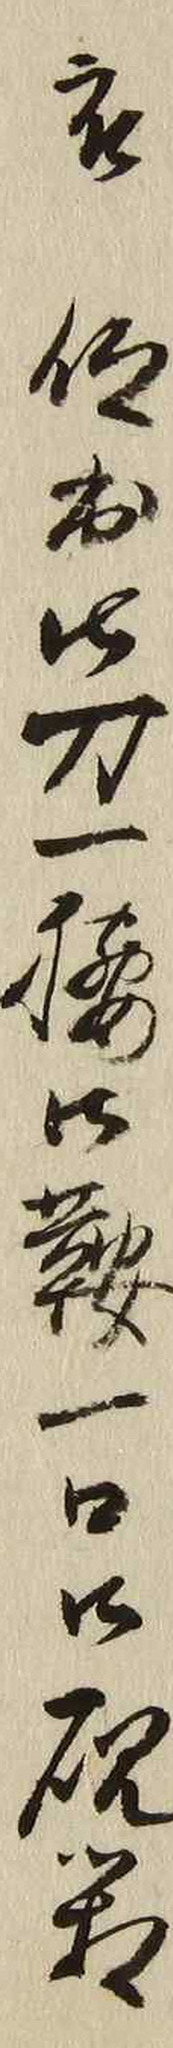被仰出御刀一腰御鞍一口硯箱
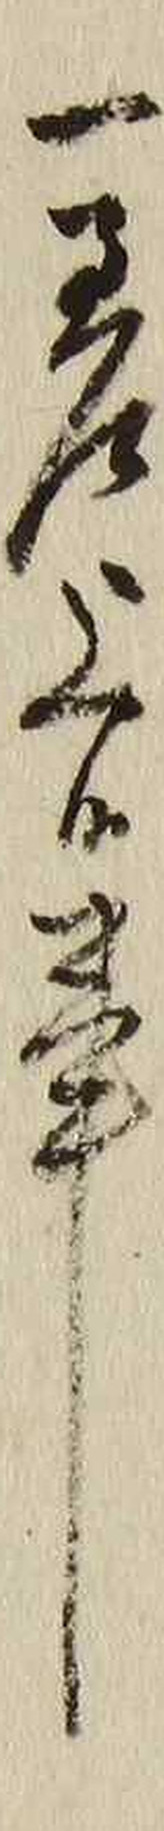一差上候事
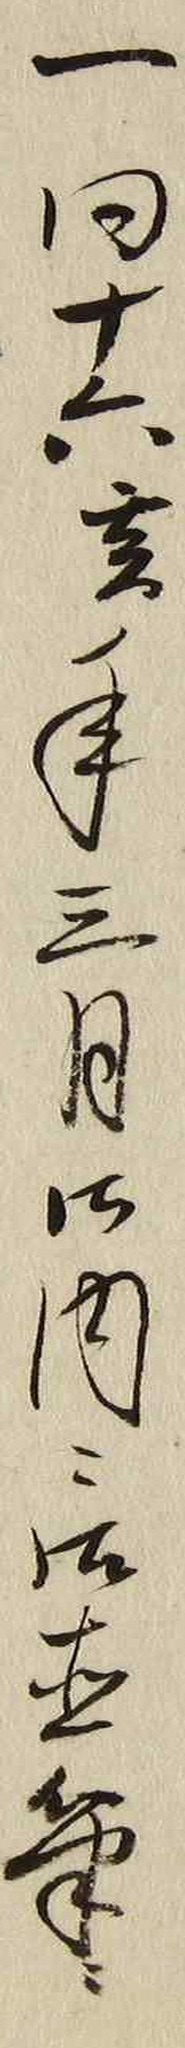一同十六亥年三月御内ニ御直筆ニ
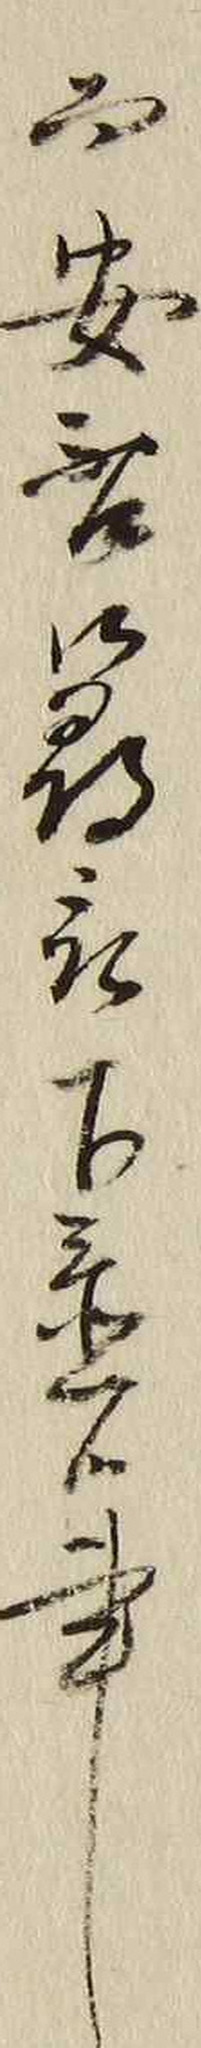而安否御尋被下置候事
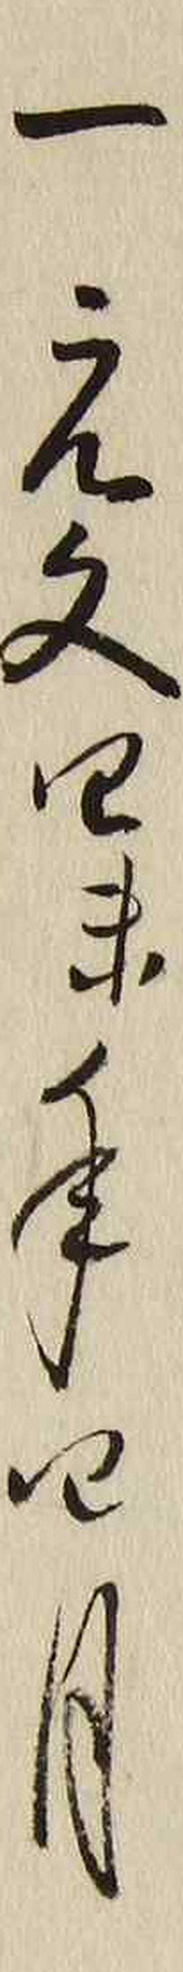一元文四未年四月
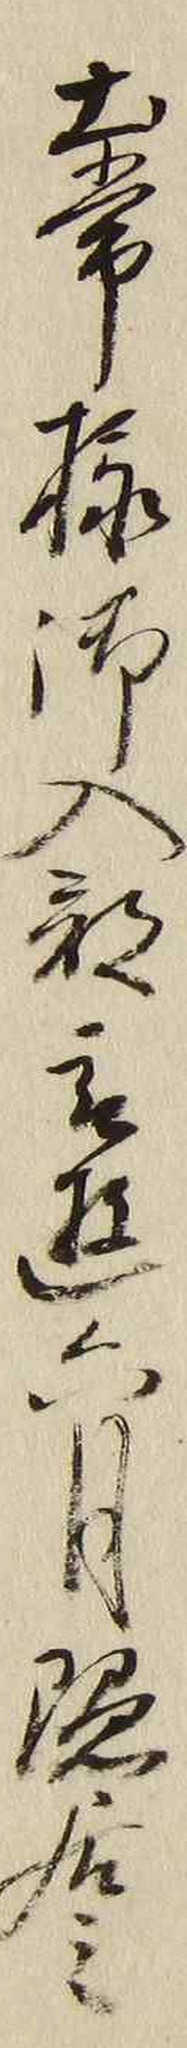土常様御入部被遊六月隠居之

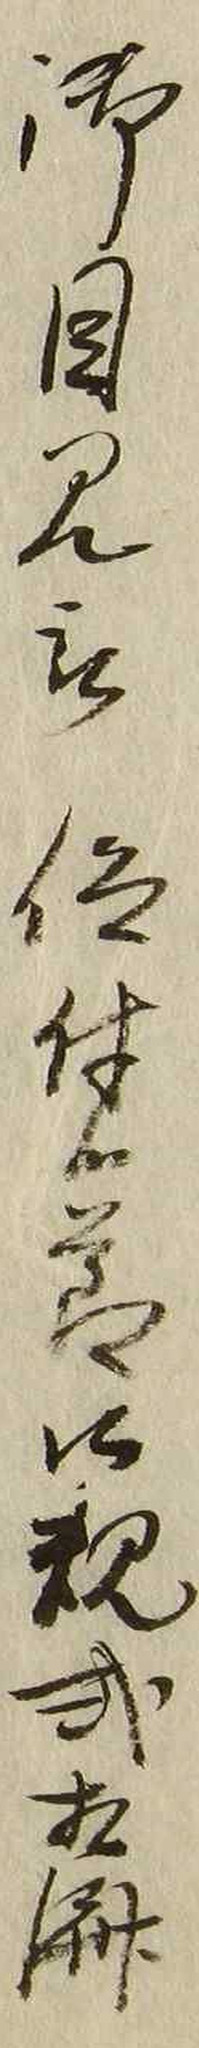御目見被仰付候節御規式相済
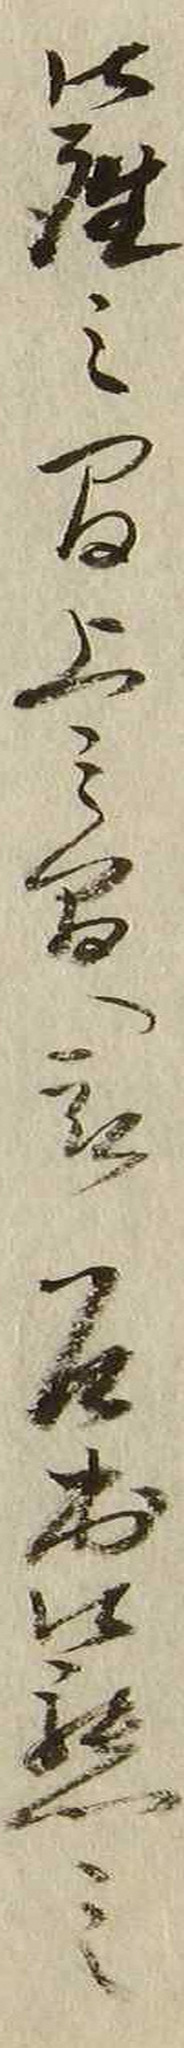御座之間上之間へ被召出御懇之
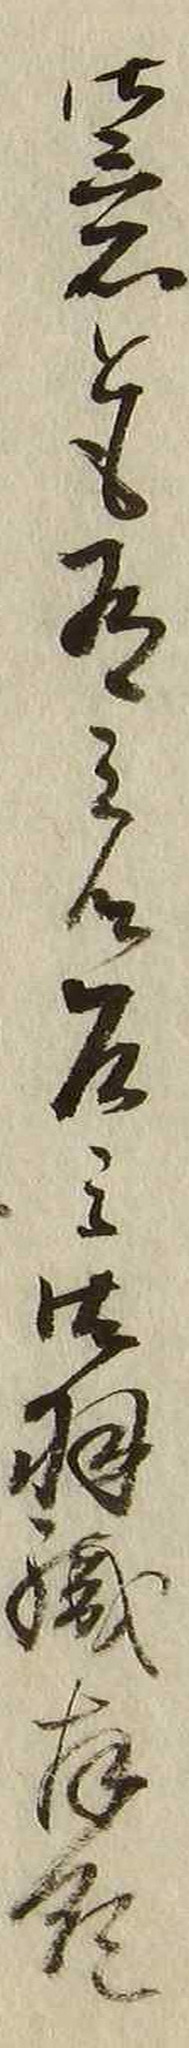御意とも有之御召之御羽織拝領
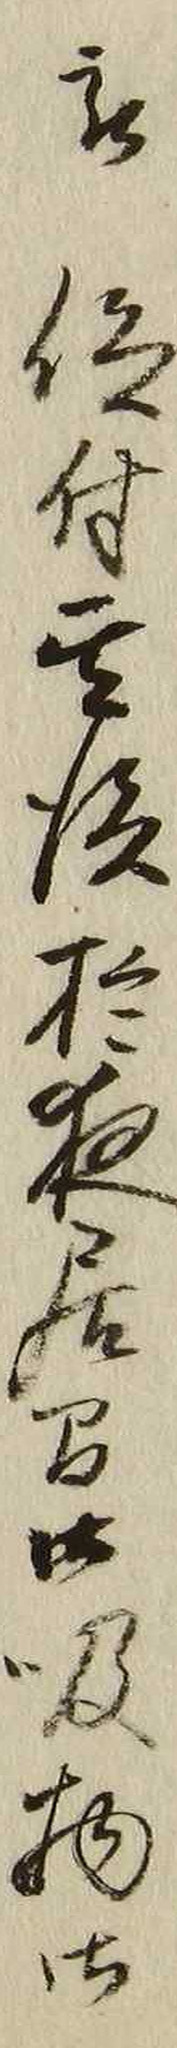被仰付其後於夜居間御吸物御
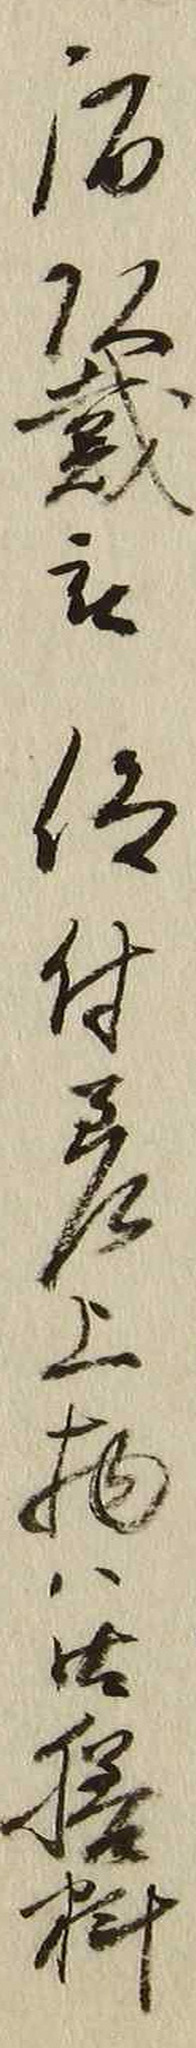酒頂戴被仰付差上物ハ御膳料
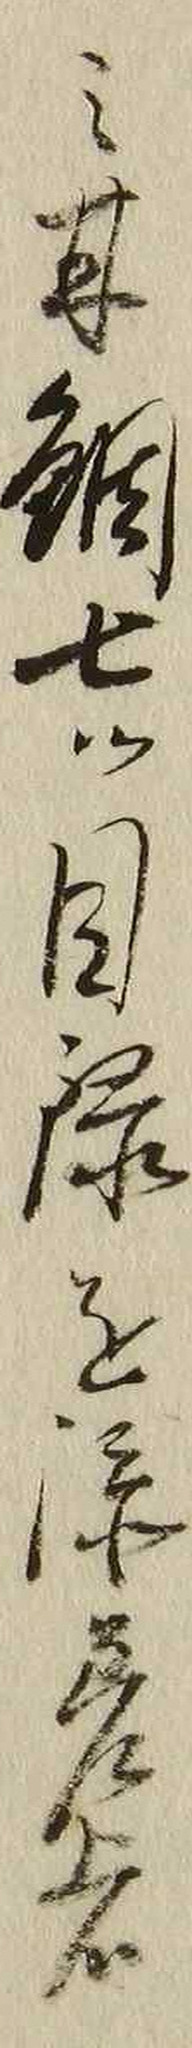之甘鯛七ツ目録を添差上候
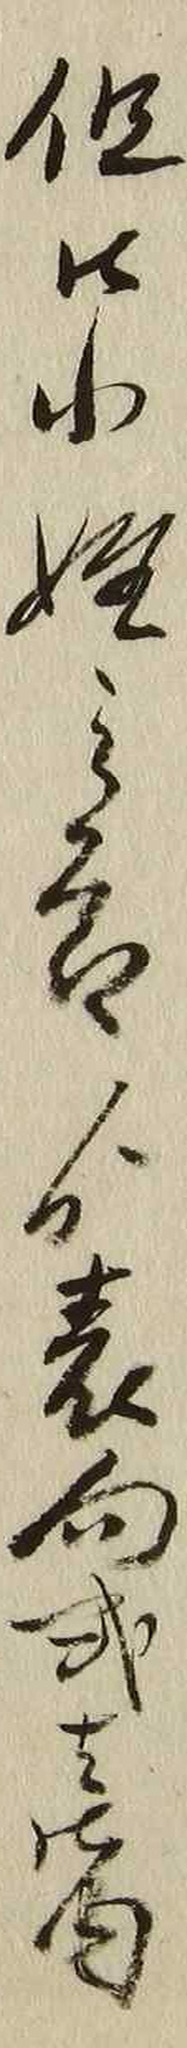但御小姓之節ゟ表向式者御内
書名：諸士系譜　巻之351　す之部1
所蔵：会津若松市立会津図書館
